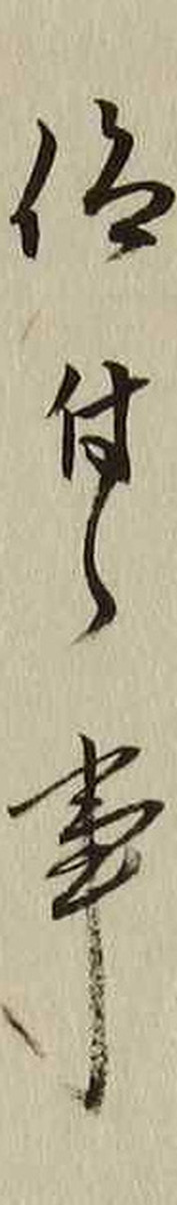仰付候事
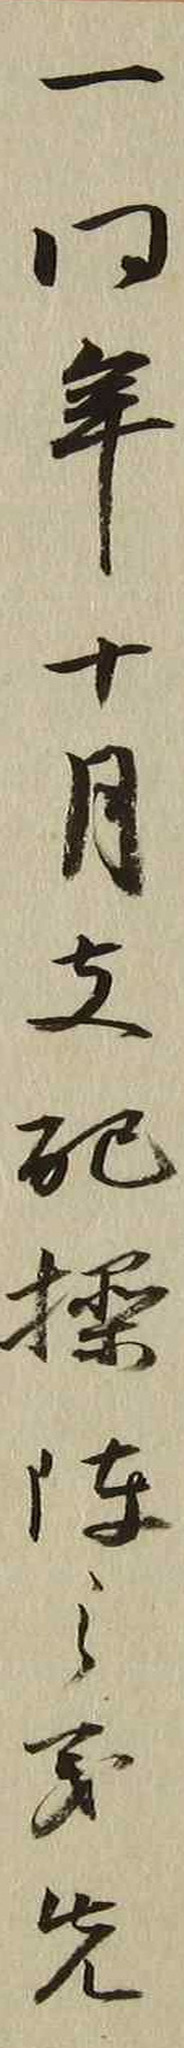一同年十月支配操陣之義先
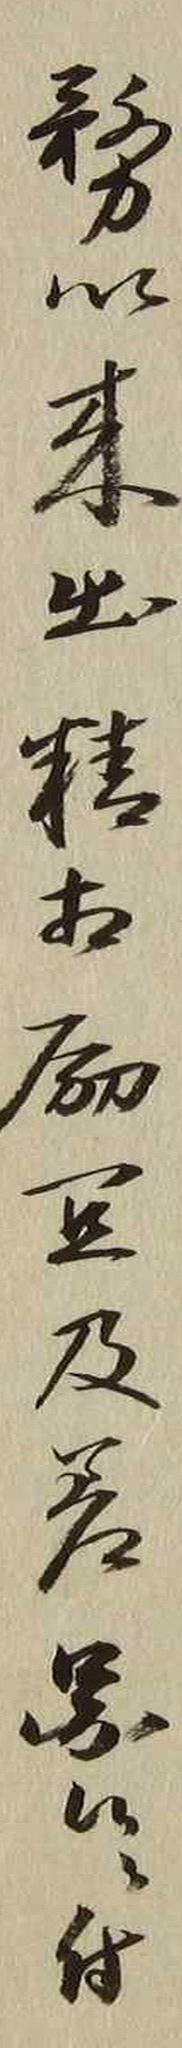務以来出精相励宜及差図候ニ付
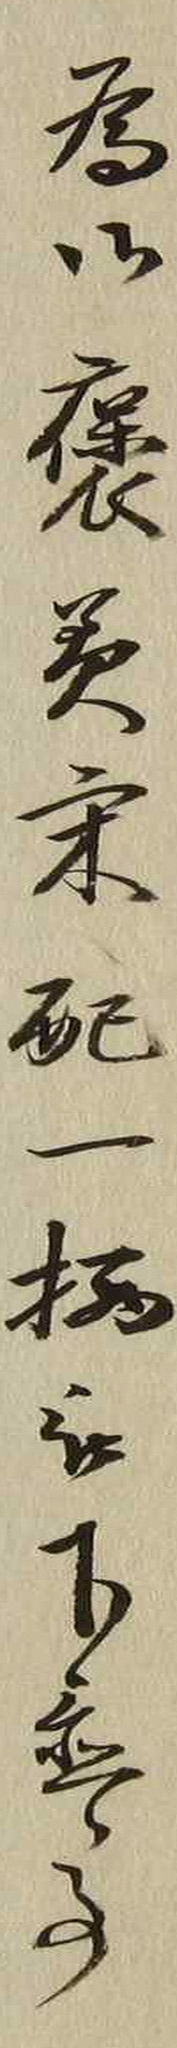為御褒美采配一柄被下置候事
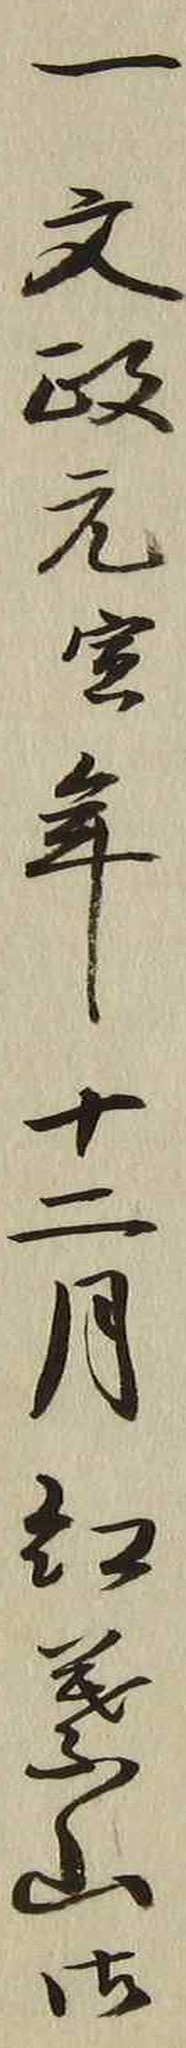一文政元寅年十二月紅葉山御
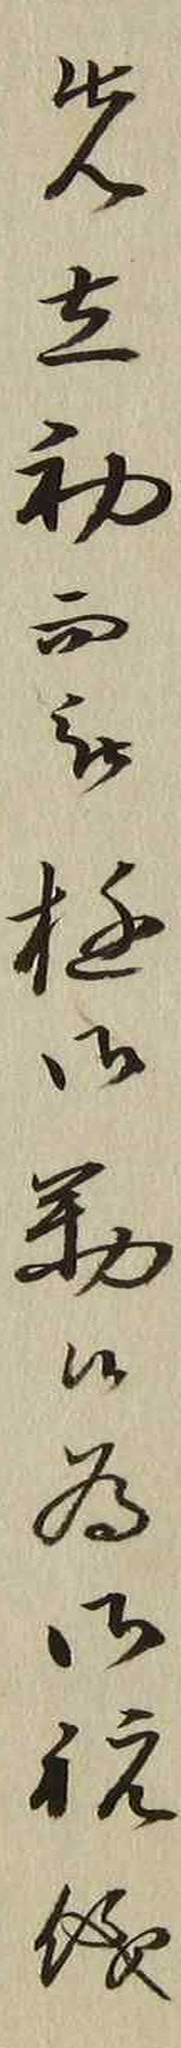先立初而被遊御勤候為御祝儀
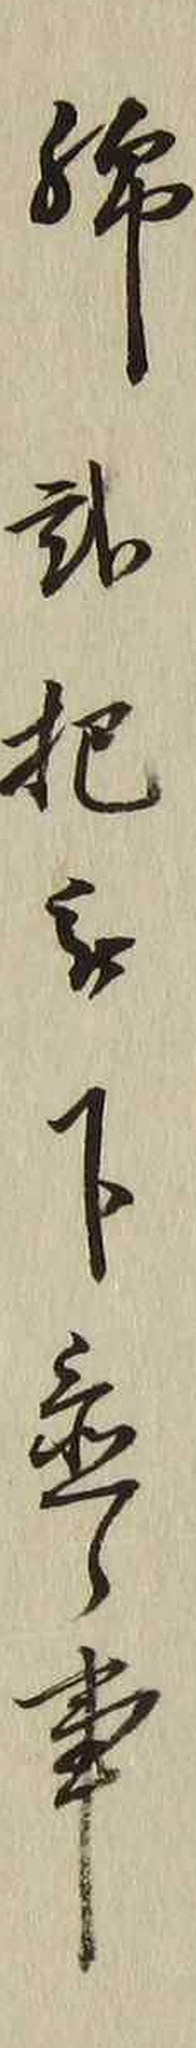綿弐把被下置候事
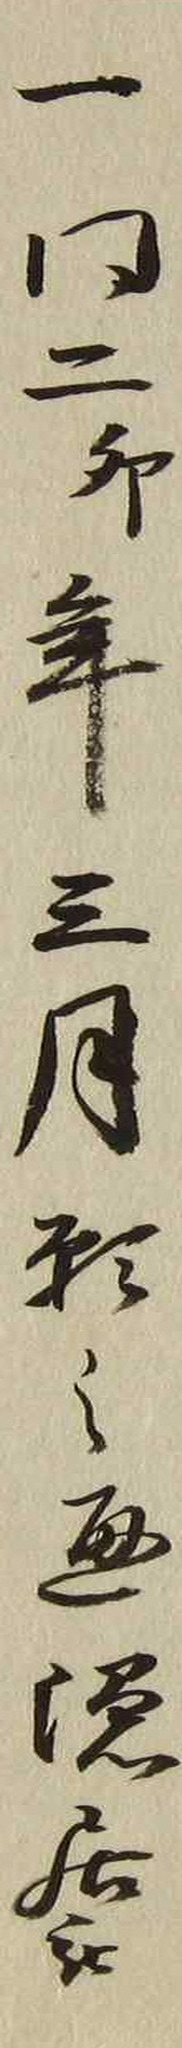一同二卯年三月願之通隠居被
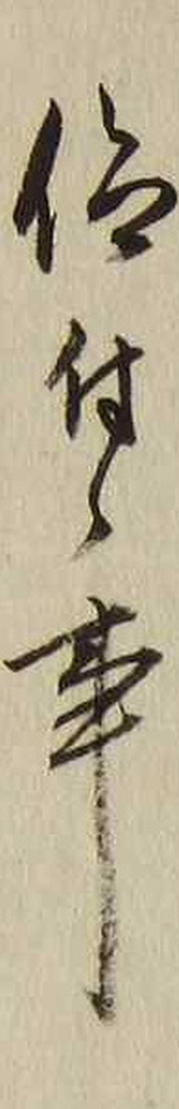仰付候事
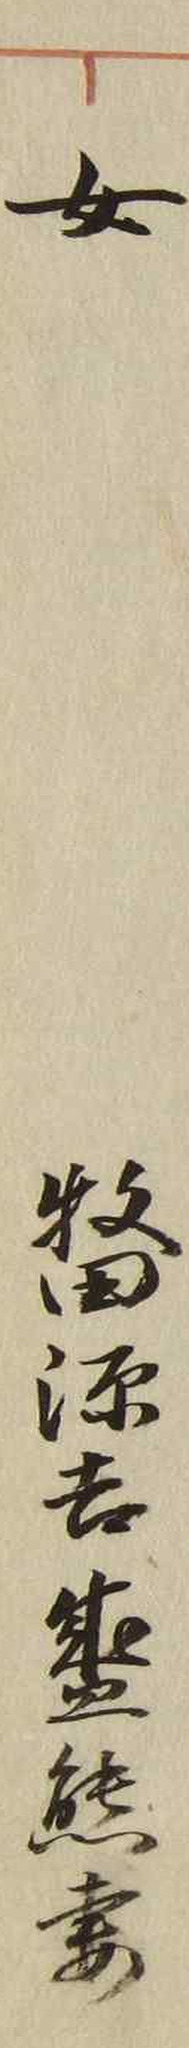女牧田源吉盛熊妻
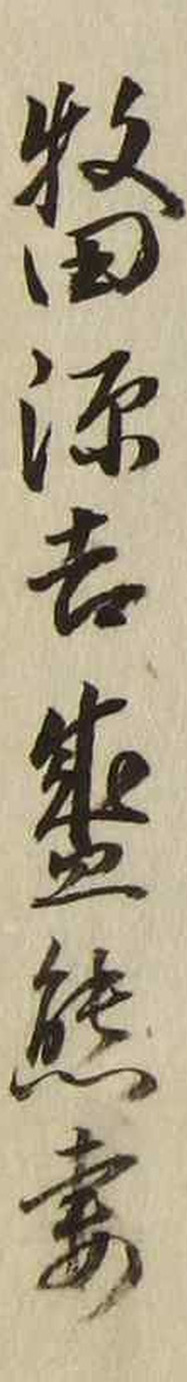女牧田源吉盛熊妻

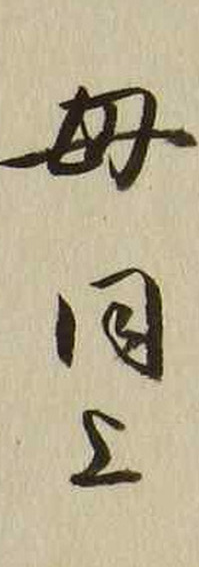母同上
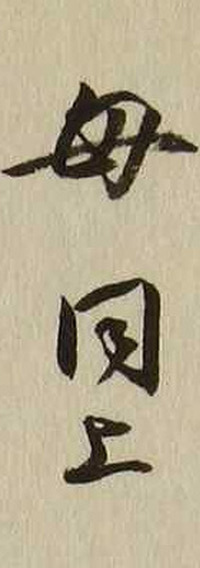母同上
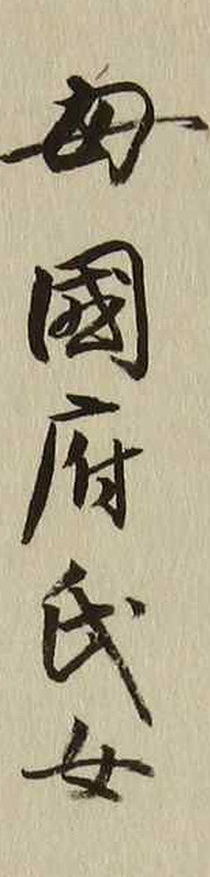母国府氏女
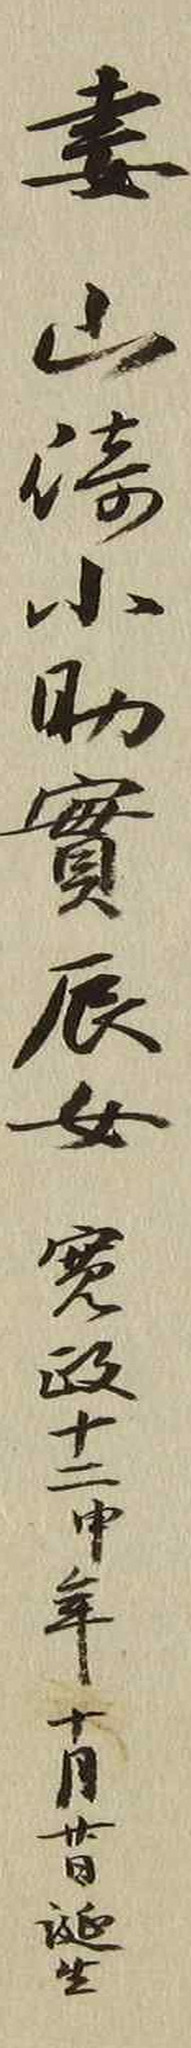妻山崎小助実辰女寛政十二申年十月廿日誕生
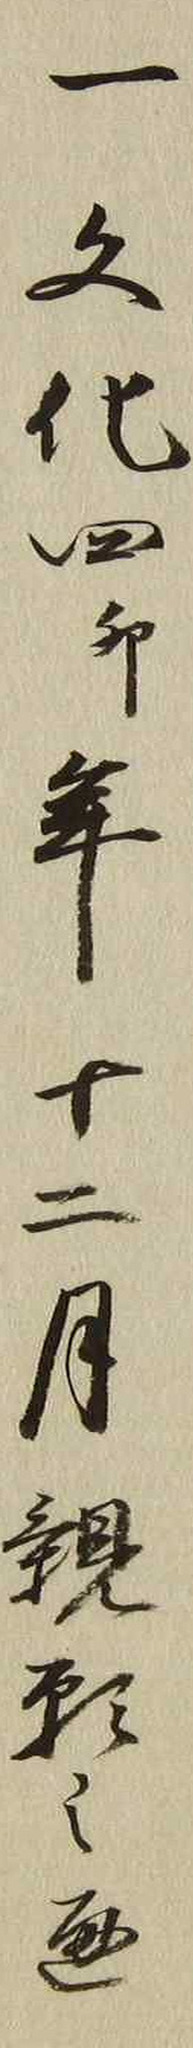一文化四卯年十二月親願之通
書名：諸士系譜　巻之69　を之部3
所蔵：会津若松市立会津図書館
